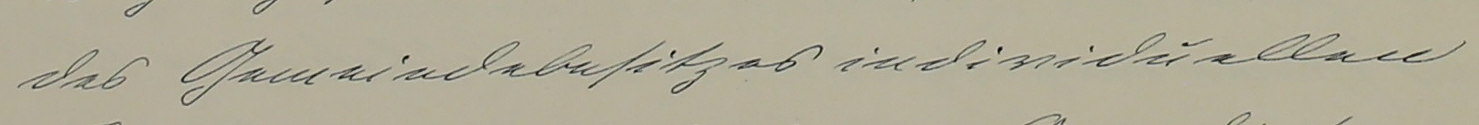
des Gemeindebesitzes individuellen
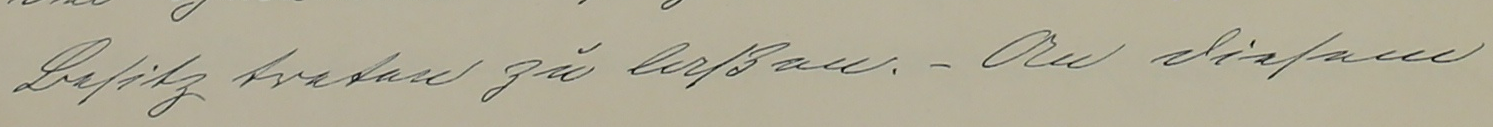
Besitz treten zu laßen. – An diesem
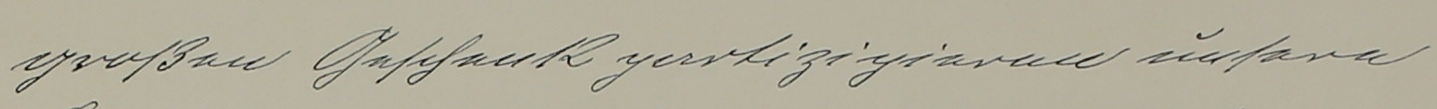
großen Geschenk partizipieren unsere
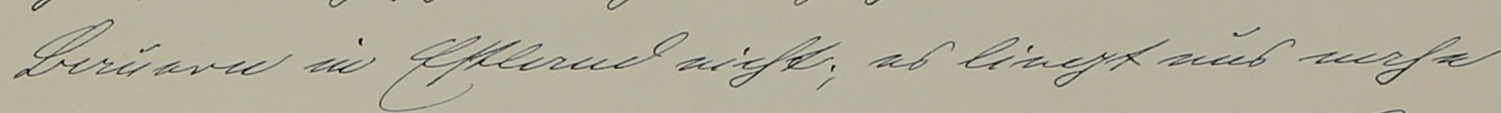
Bauern in Estland nicht; es liegt uns nahe
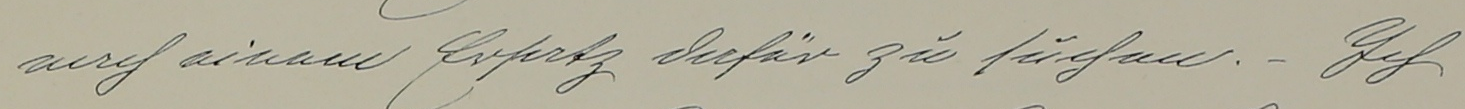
nach einem Ersatz dafür zu suchen. – Ich
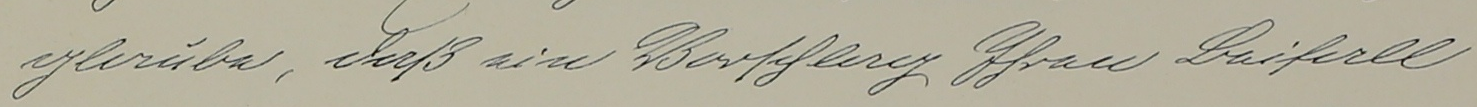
glaube, daß ein Vorschlag Ihren Beifall
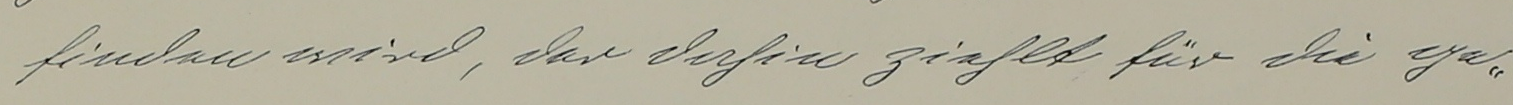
finden wird, der dahin zielt für die ge-
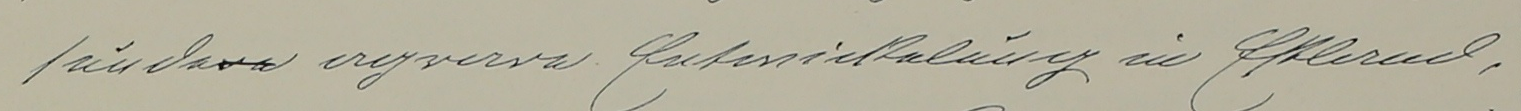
sundere agrare Entwickelung in Estland,
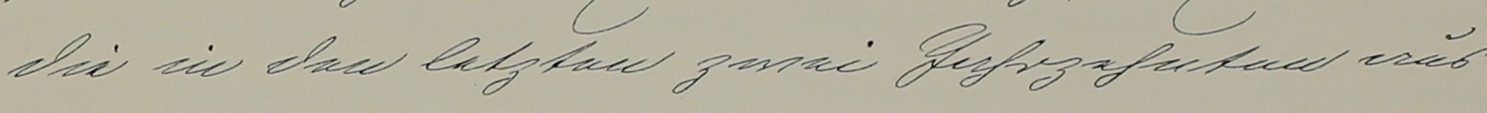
die in den letzten zwei Jahrzehnten aus
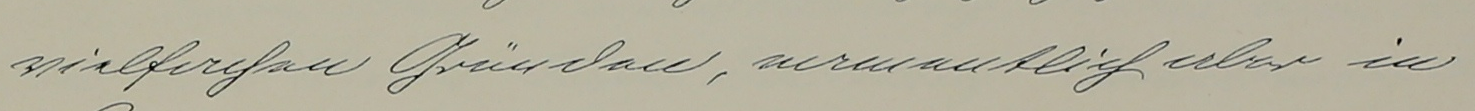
vielfachen Gründen, namentlich aber in
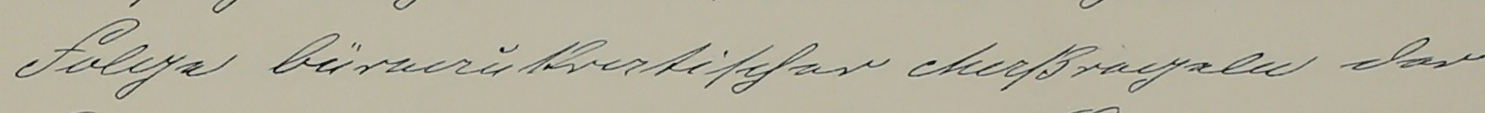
Folge büreaukratischer Maßregeln der
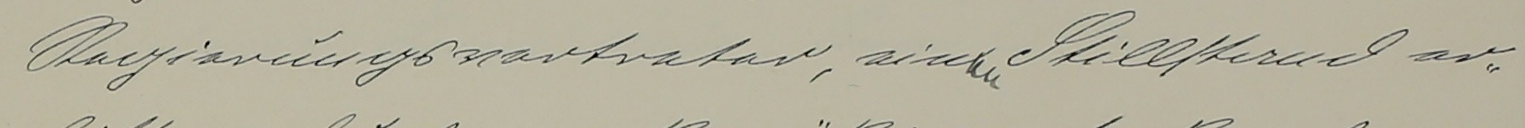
Regierungsvertreter, einen Stillstand er-
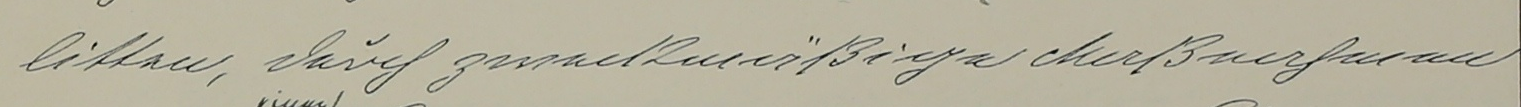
litten, durch zweckmäßige Maßnahmen
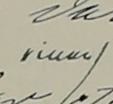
einen
